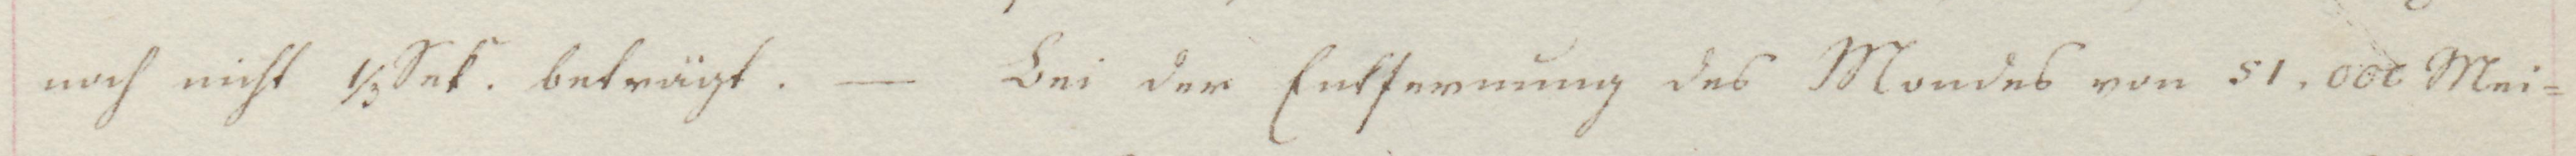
noch nicht ⅓ Sek. beträgt. – Bei der Entfernung des Mondes von 51,000 Mei-
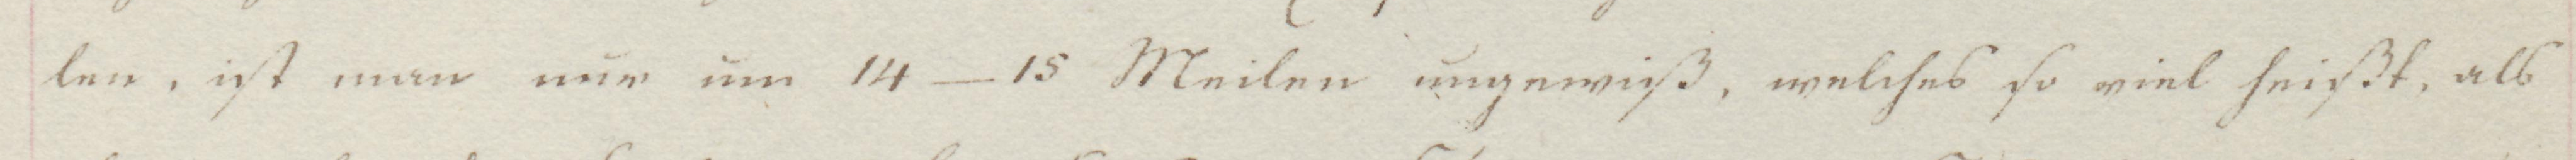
len ist man nur um 14–15 Meilen ungewiß, welches so viel heißt, als
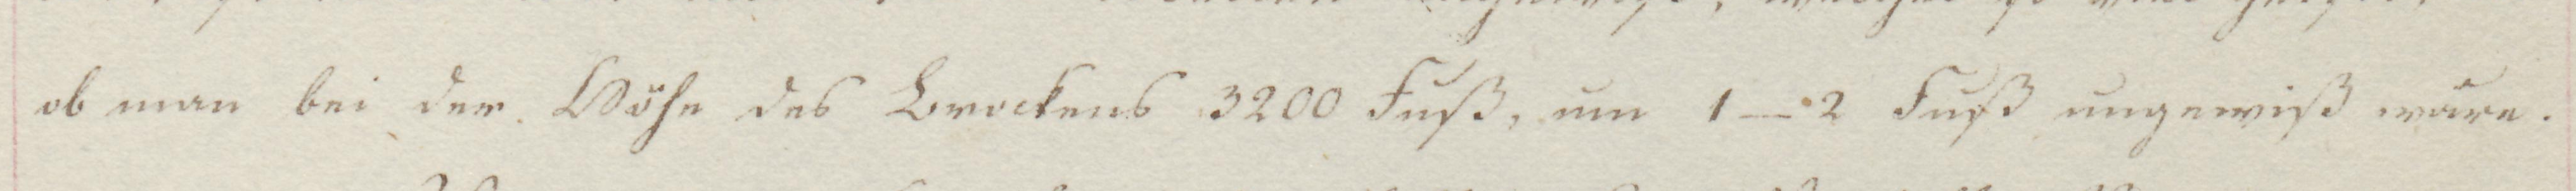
ob man bei der Höhe des Brockens 3200 Fuß, um 1–2 Fuß ungewiß wäre.
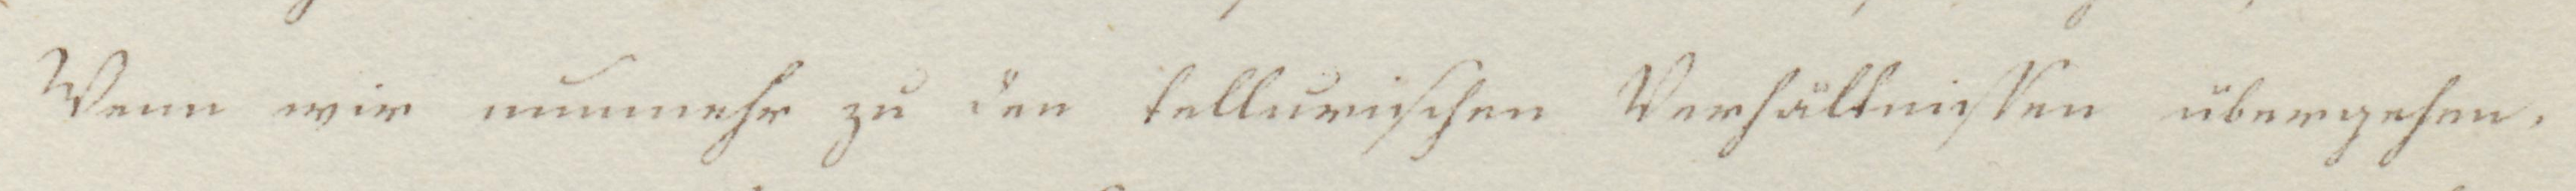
Wenn wir nunmehr zu den tellurischen Verhältnissen übergehen,
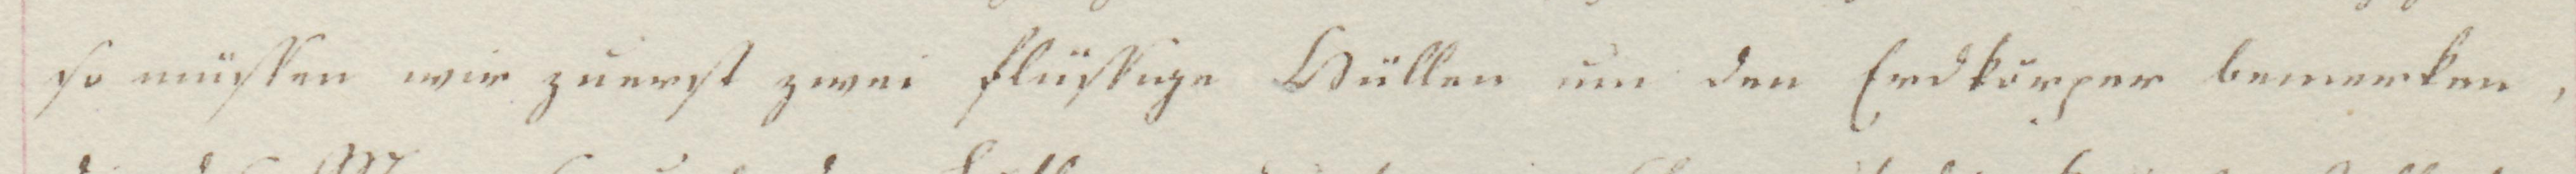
so müssen wir zuerst zwei flüssige Hüllen um den Erdkörper bemerken,
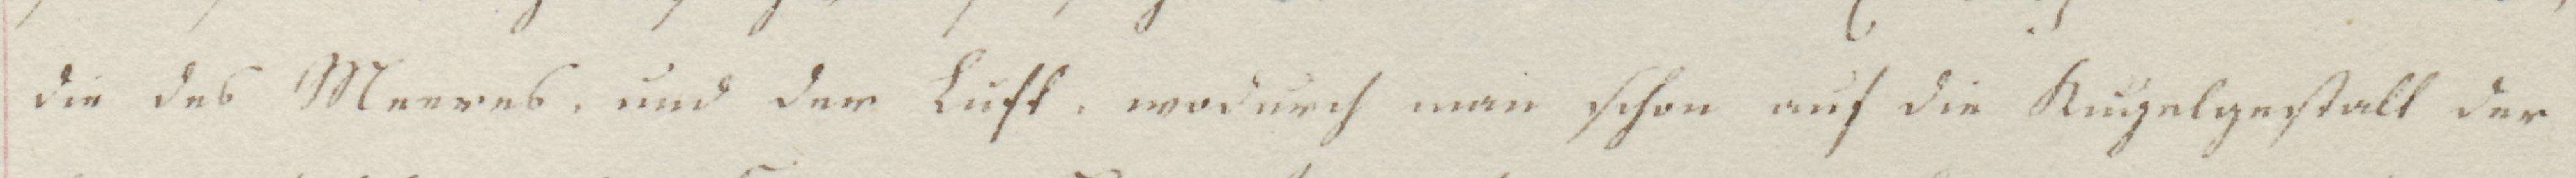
die des Meeres und der Luft, wodurch man schon auf die Kugelgestalt der
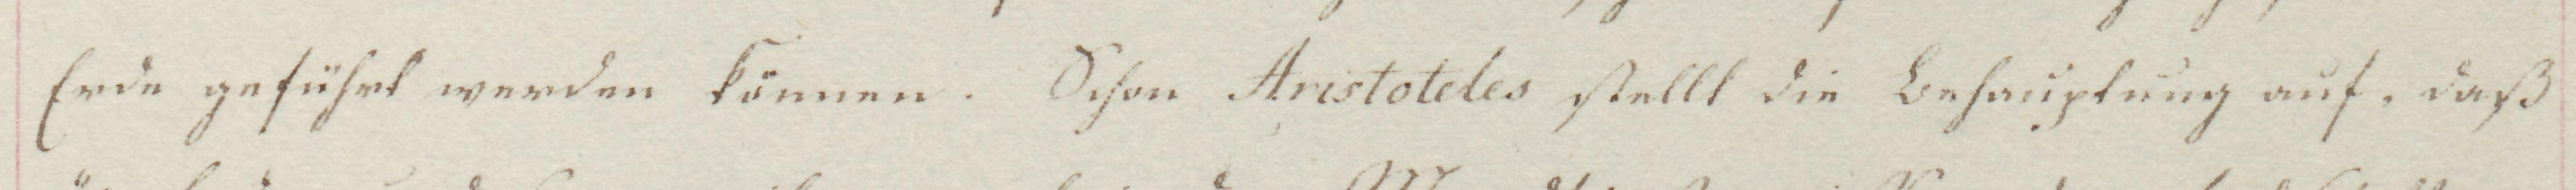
Erde geführt werden . Schon Aristoteles stellt die Behauptung auf, daß
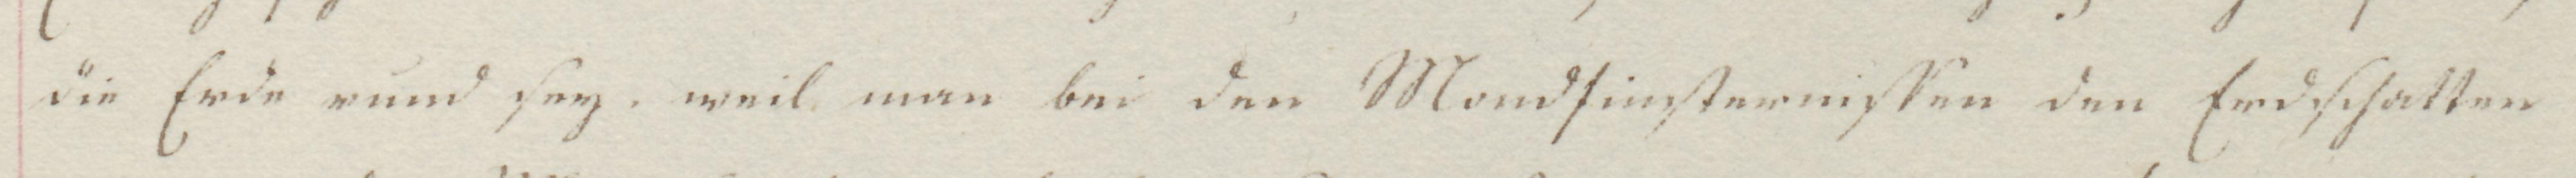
die Erde rund sey, weil man bei den Mondfinsternissen den Erdschatten
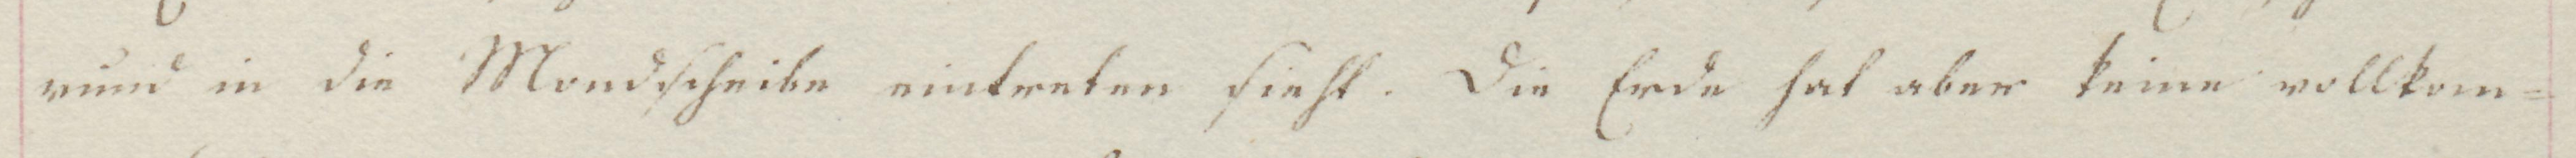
rund in die Mondscheibe eintreten sieht. Die Erde hat aber keine vollkom-
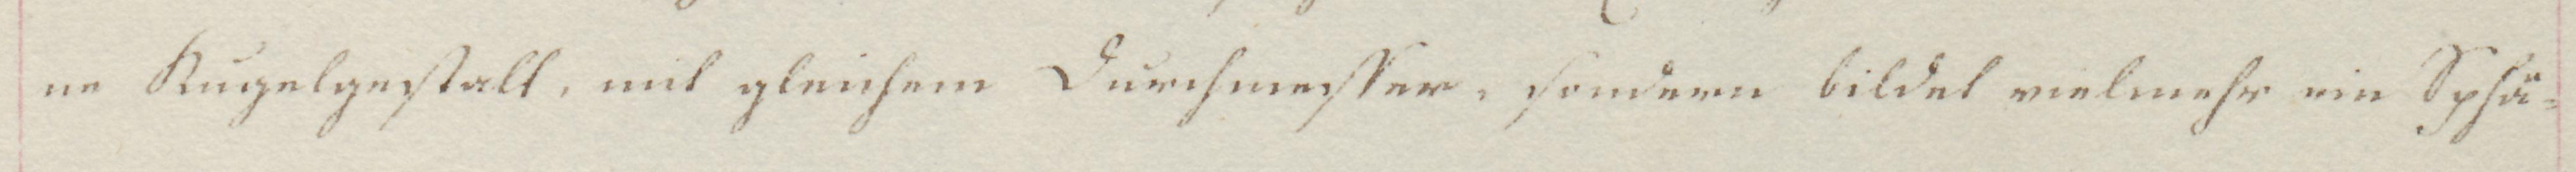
ne Kugelgestalt, mit gleichem Durchmesser, sondern bildet vielmehr ein Sphä-
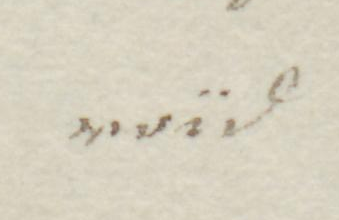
roïd
